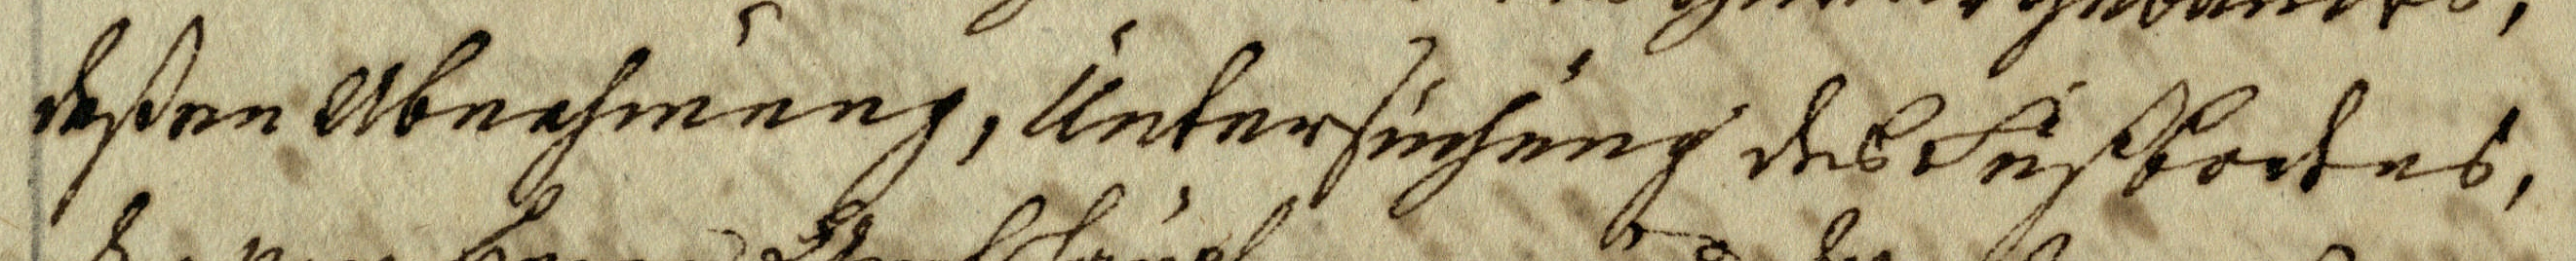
deßen Abnehmung, Untersuchung des Fußbodens,
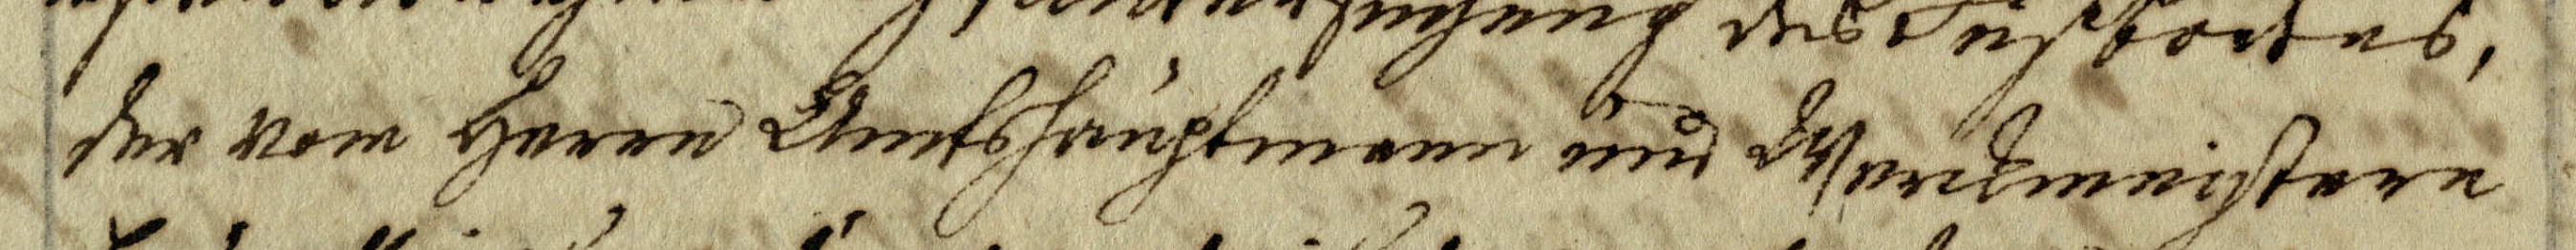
der vom Herrn Amtshauptmann und Werkmeistern
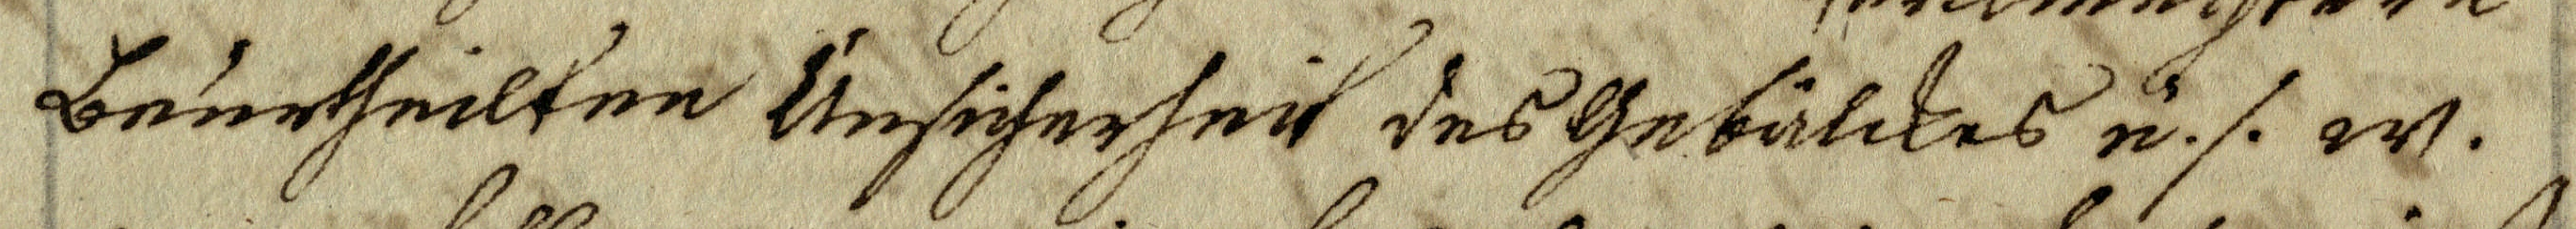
beurtheilten Unsicherheit des Gebäudes u.s.w.
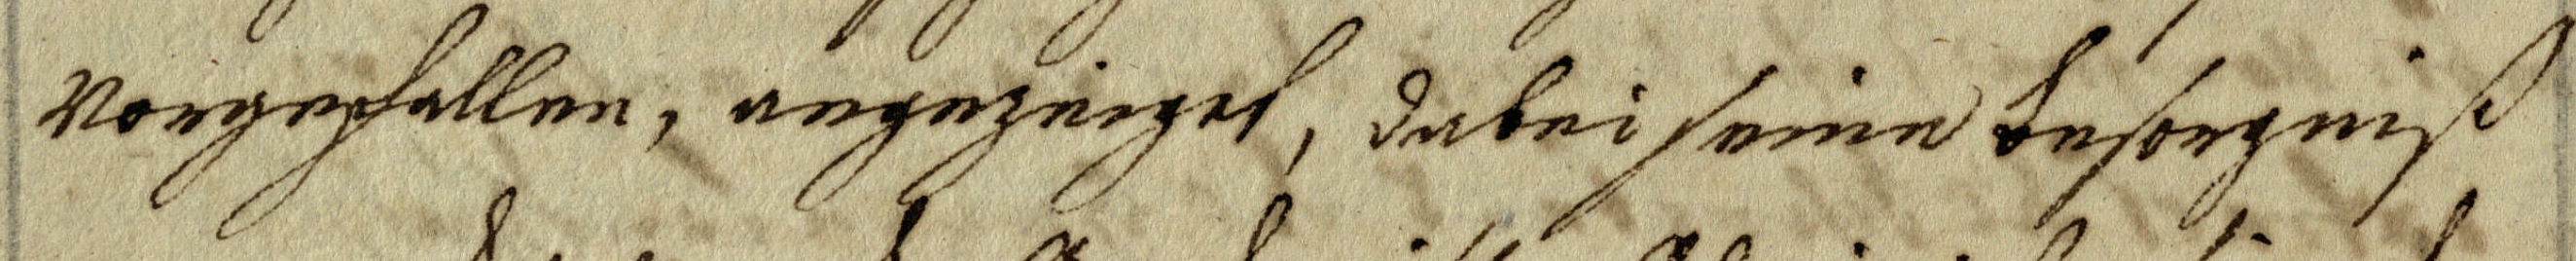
vorgefallen, angezeiget, dabei seine Besorgniß
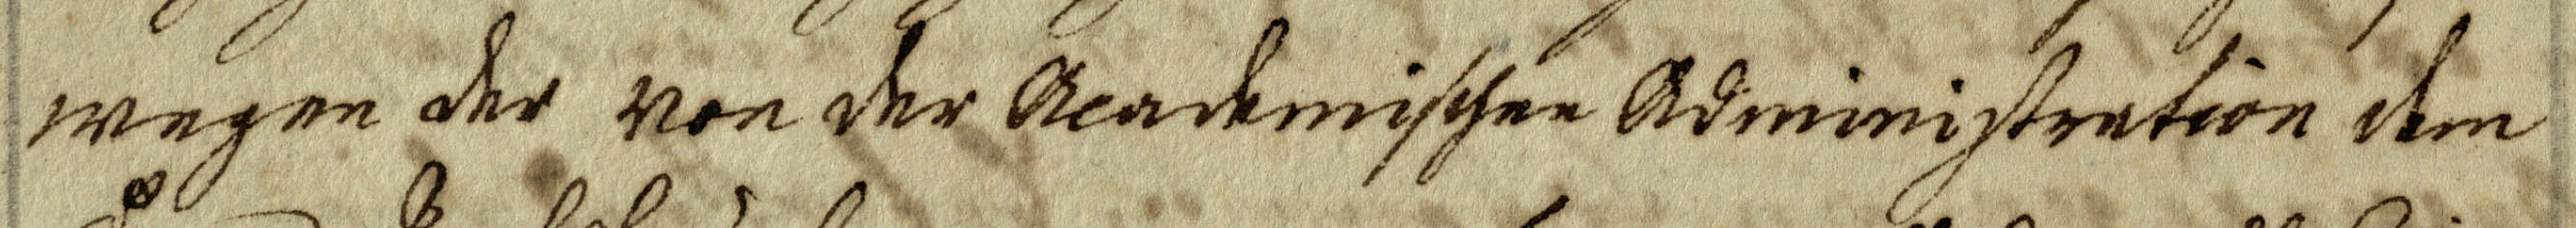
wegen der von der Academischen Administration dem
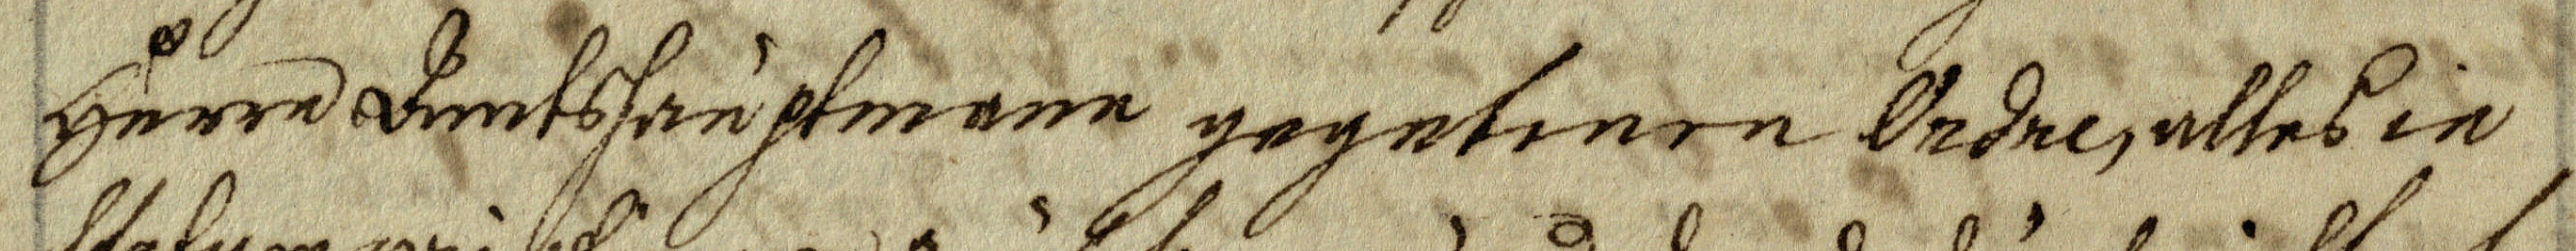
Herrn Amtshauptmann gegebenen Ordre, alles in
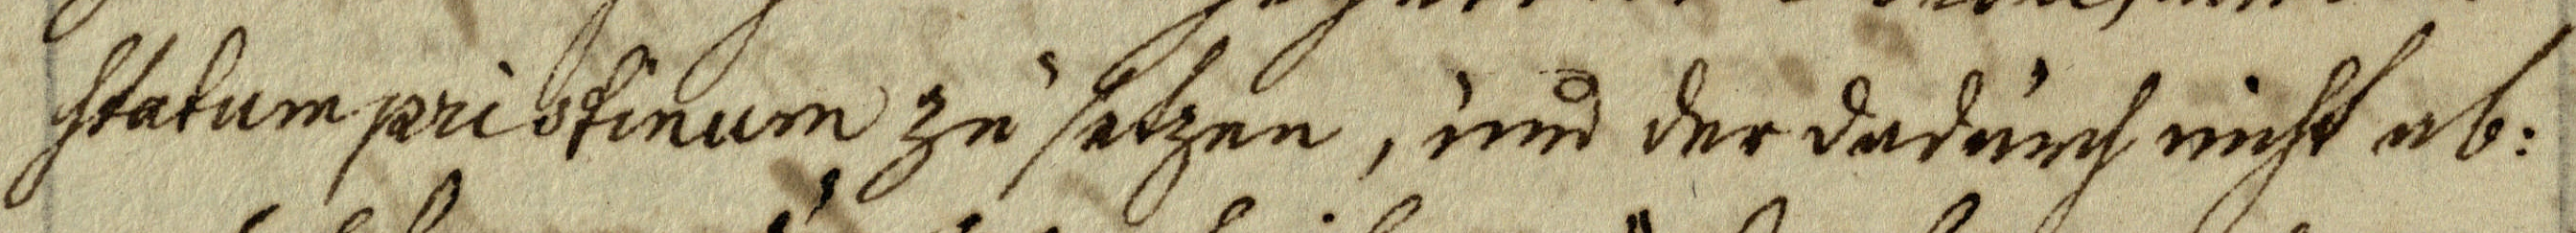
statum pristinum zu setzen, und der dadurch nicht ab¬
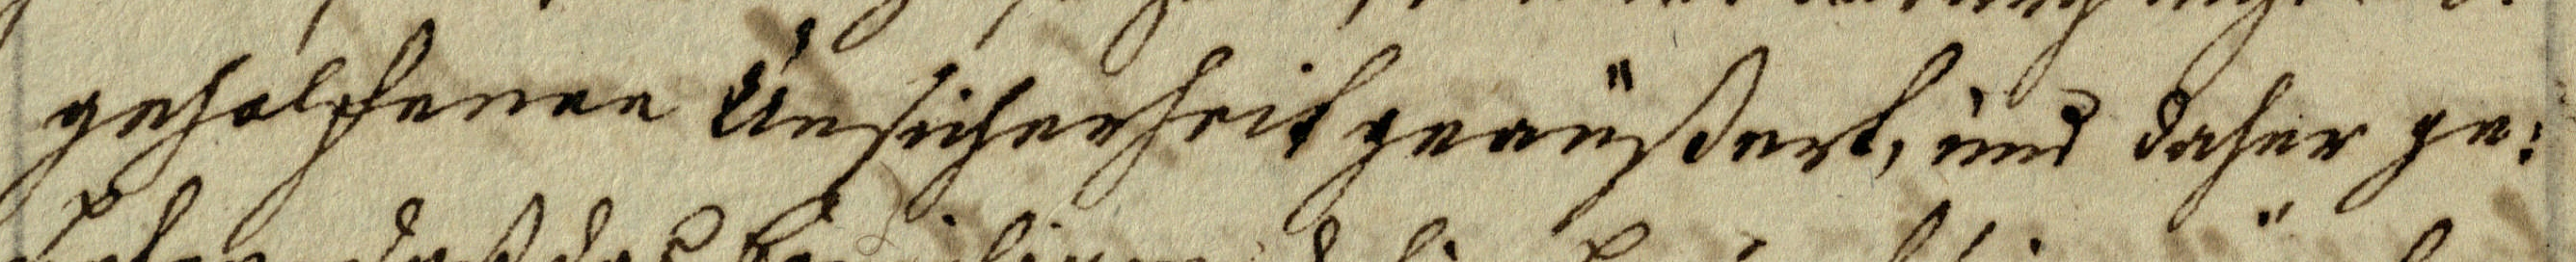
geholfenen Unsicherheit geäußert, und daher ge¬
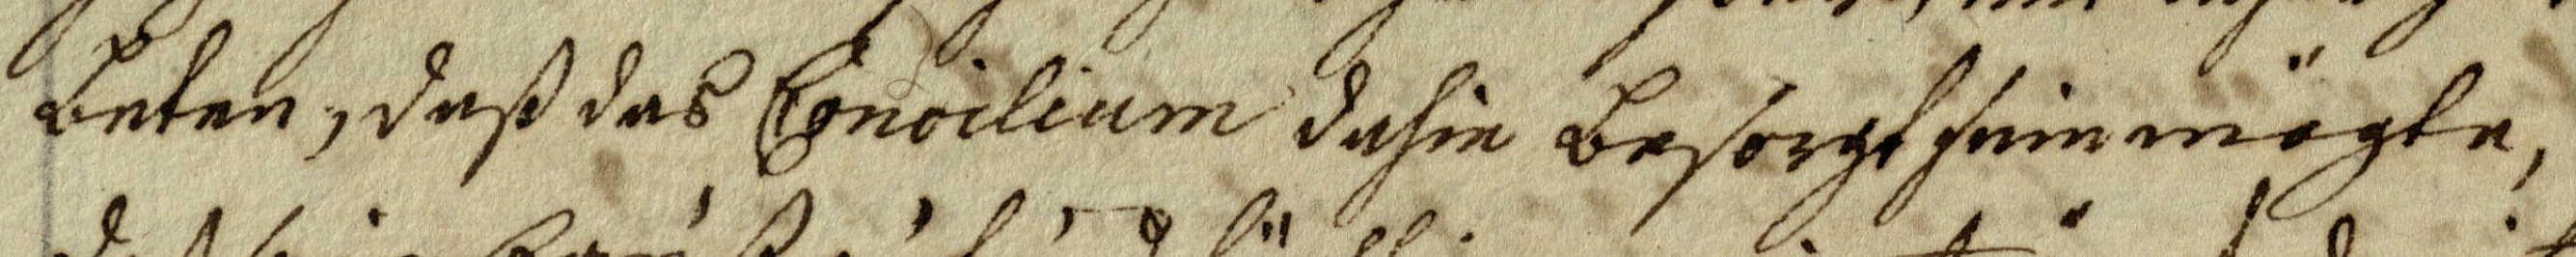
beten, daß das Concilium dahin besorgt sein mögte,
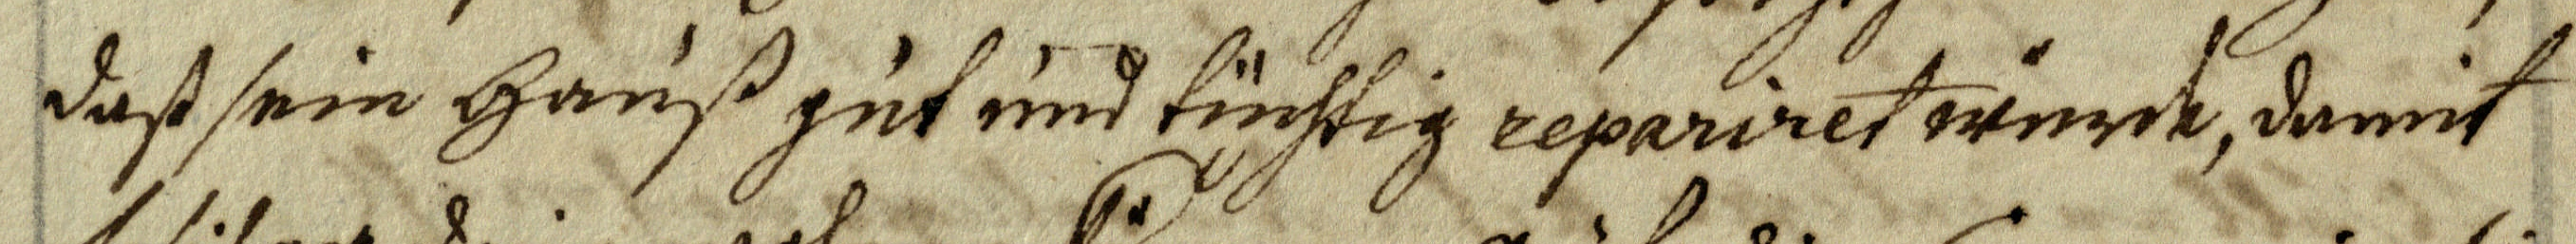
daß sein Haus gut und tüchtig repariret würde, damit
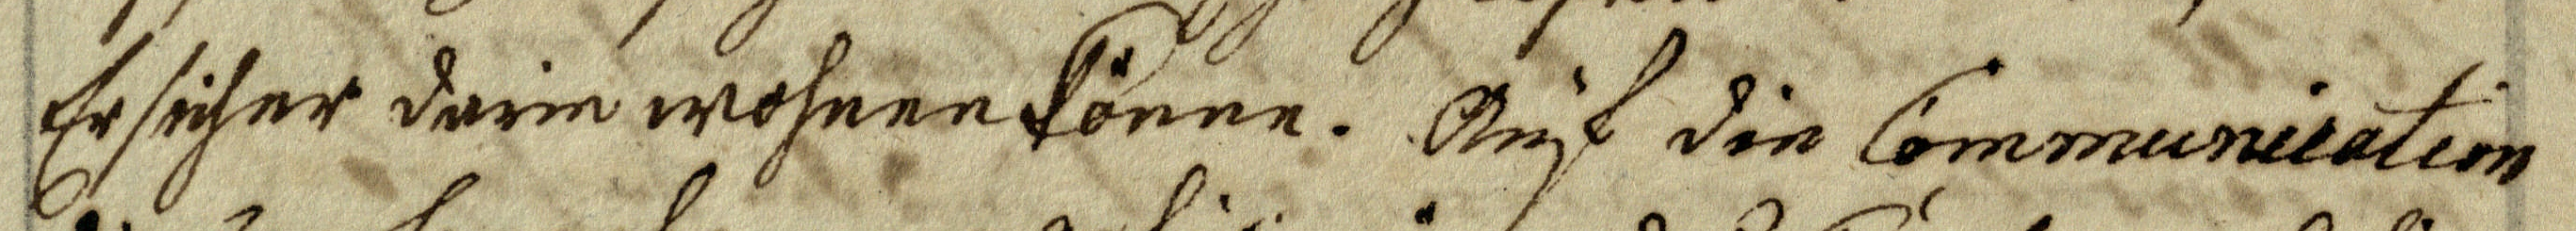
Er sicher darin wohnen könne. Auf die Communication
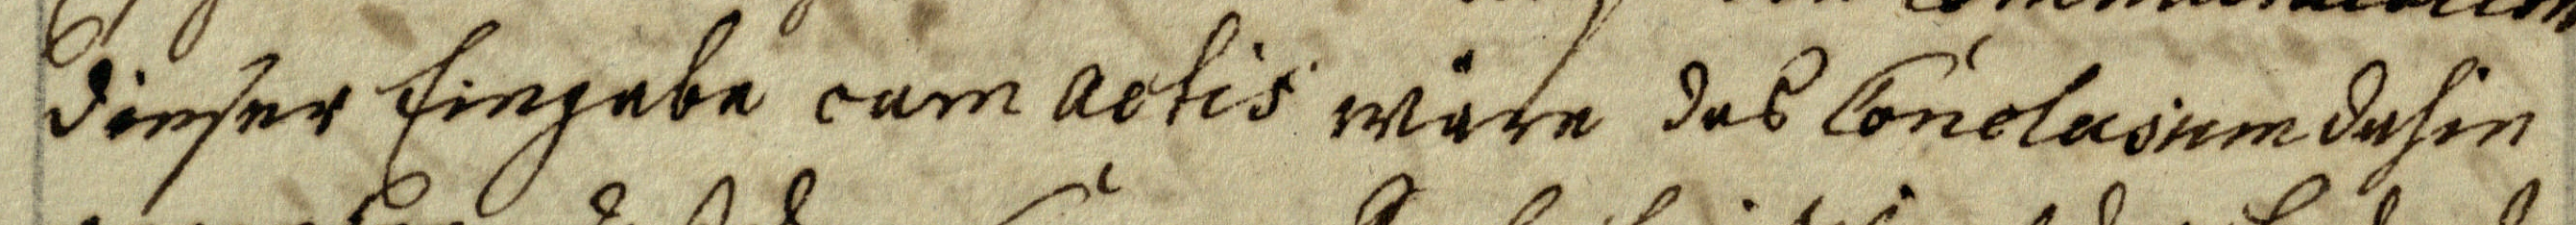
dieser Eingabe cum actis wäre das Conclusum dahin
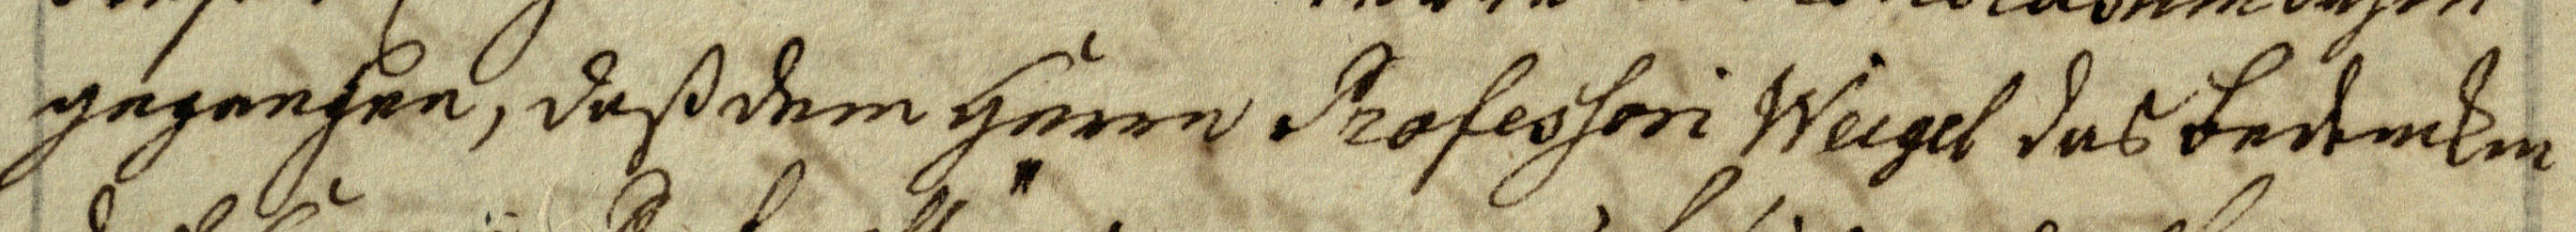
gegangen, daß dem Herrn Professori Weigel das Bedenken
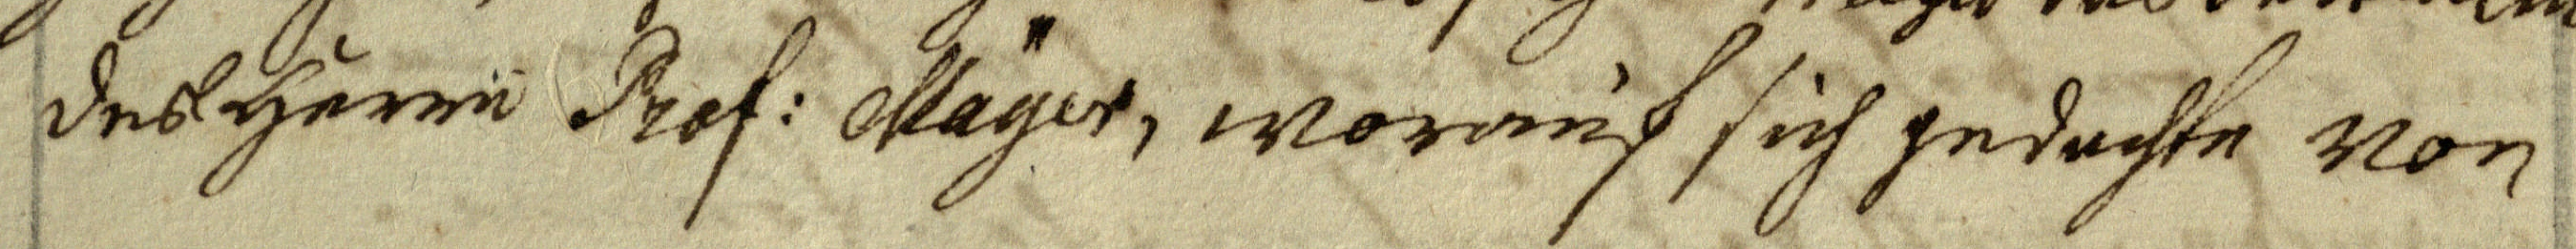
des Herrn Prof. Maÿer, worauf sich gedacht von
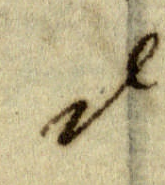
d
